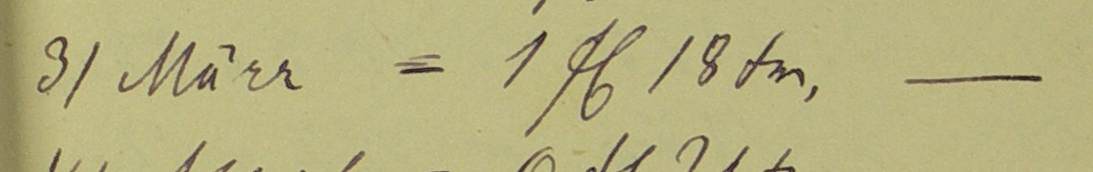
3.) März = 1 * 18 * --
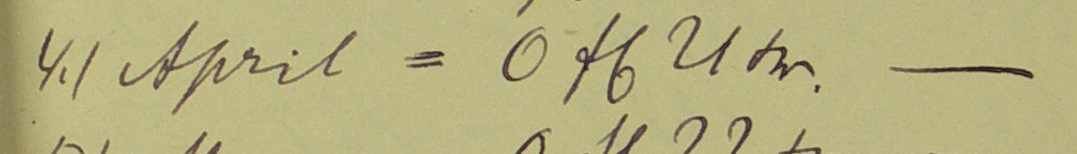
4.) April = 0 * 21 * --
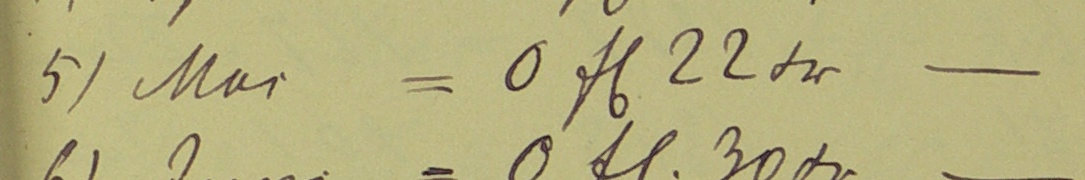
5.) Mai = 0 * 22 * --
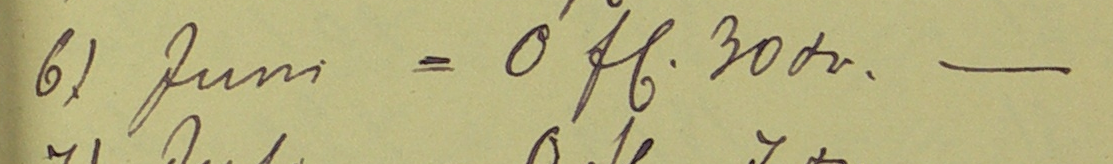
6.) Juni = 0 * 30 * --
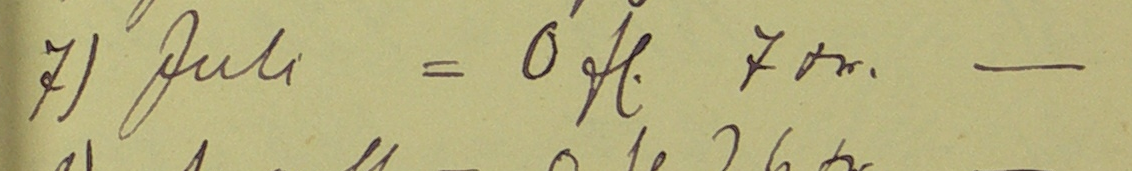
7.) Julie = 0 * 7 * --
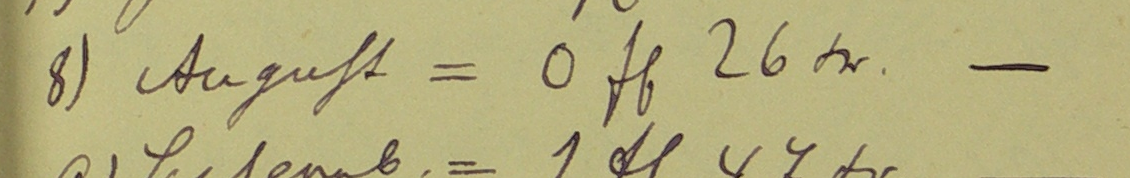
8.) August = 0 * 26 * --
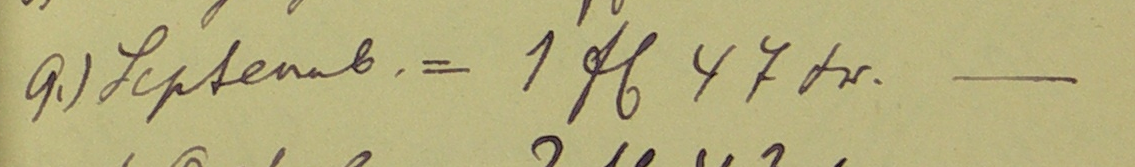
9.) Septemb. = 1 * 47 * --
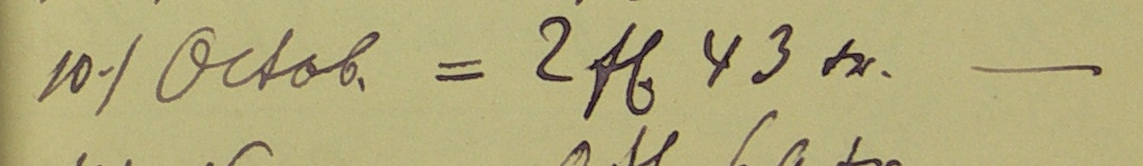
10.) Octob. = 2 * 43 * --
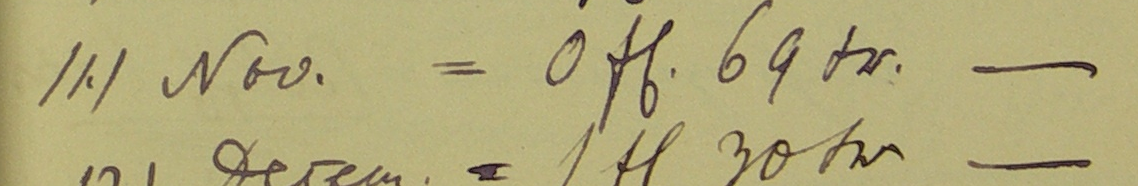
11.) Novem. = 0 * 69 * --
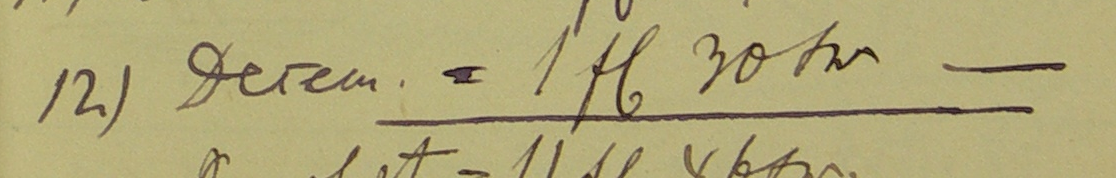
12.) Decem. = 1 * 30 * --
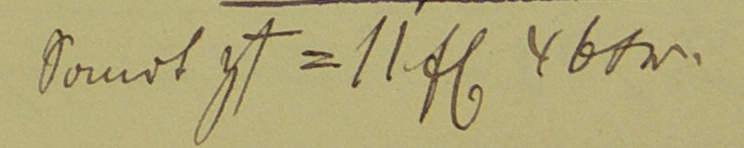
Somit zusammen = 11 * 46 *
